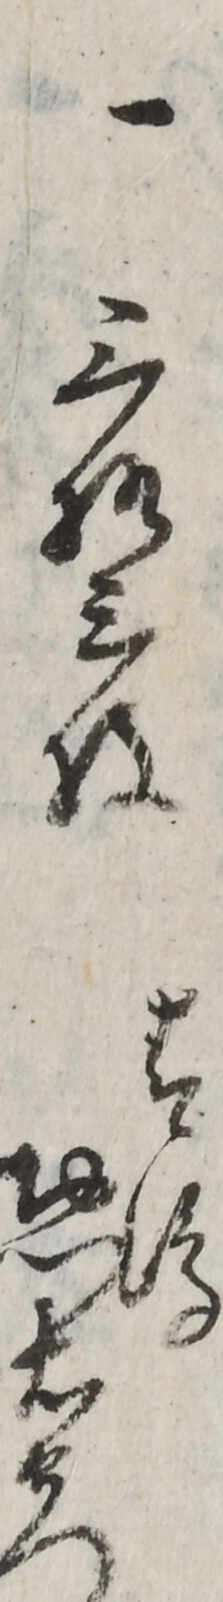一弐百拾九枚金右衛門

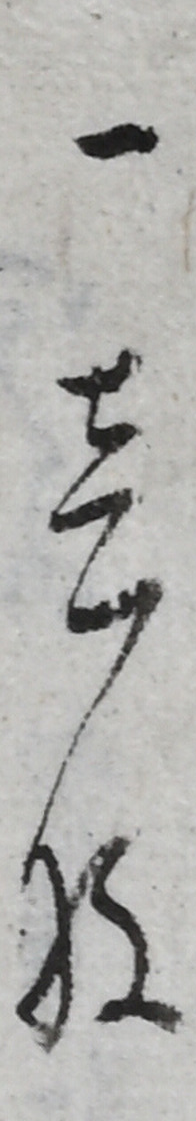一四枚
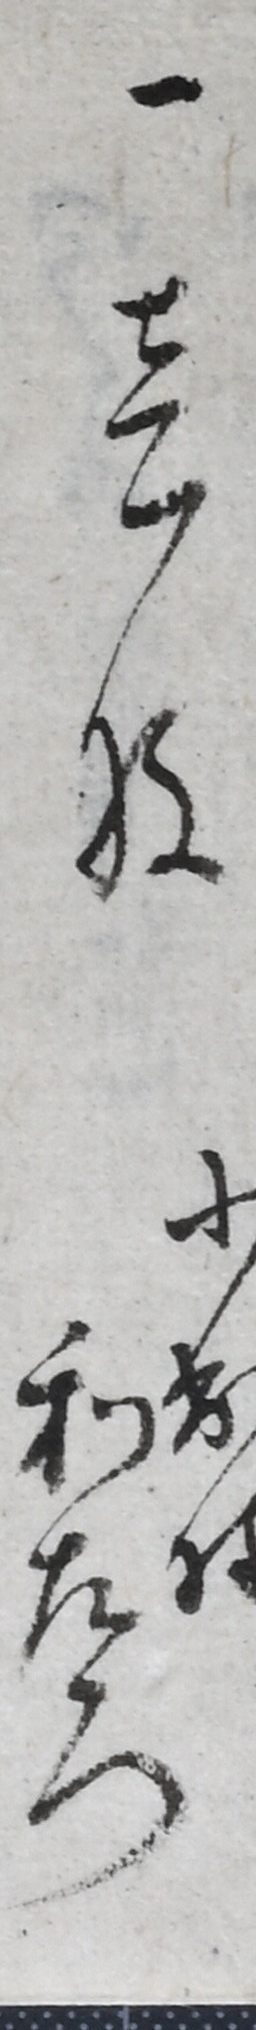一九枚長左衛門
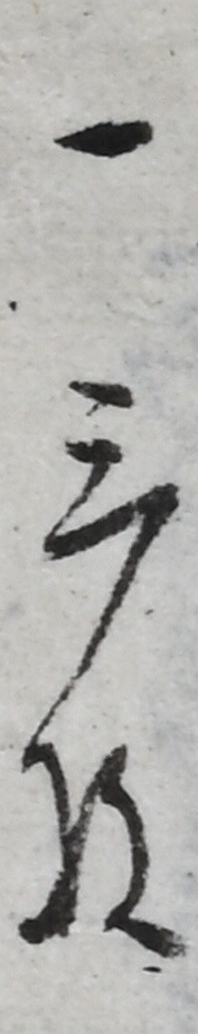一四枚
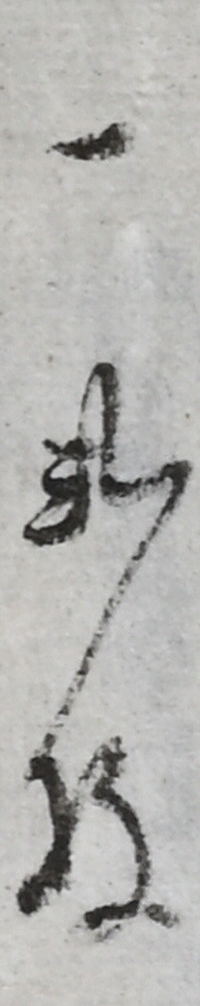一四枚
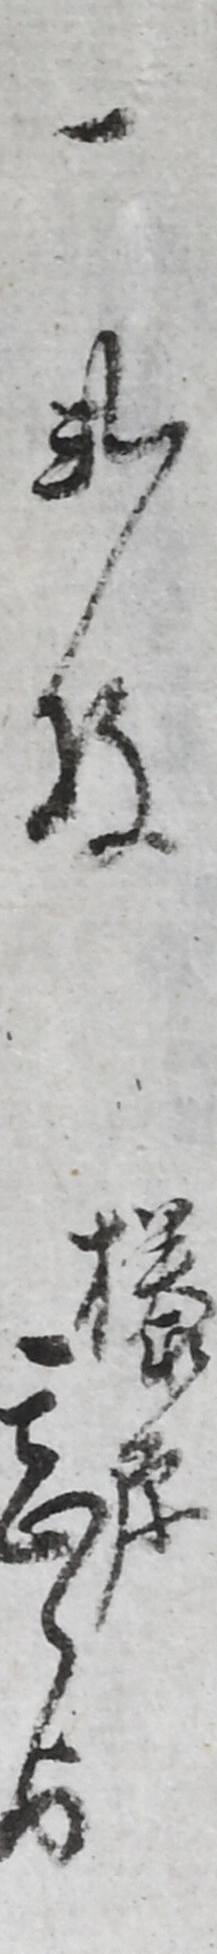一弐枚芦沢
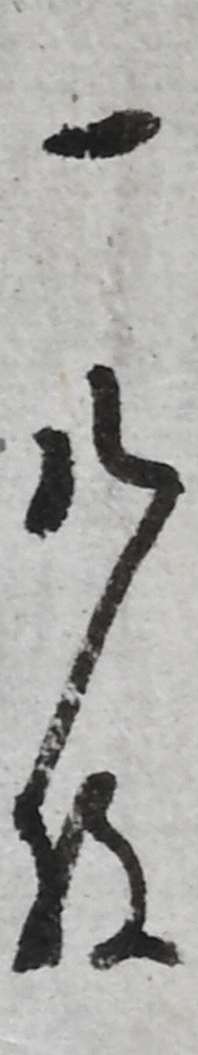一四枚
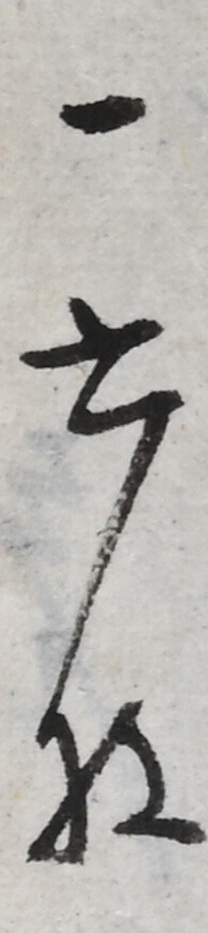一四枚
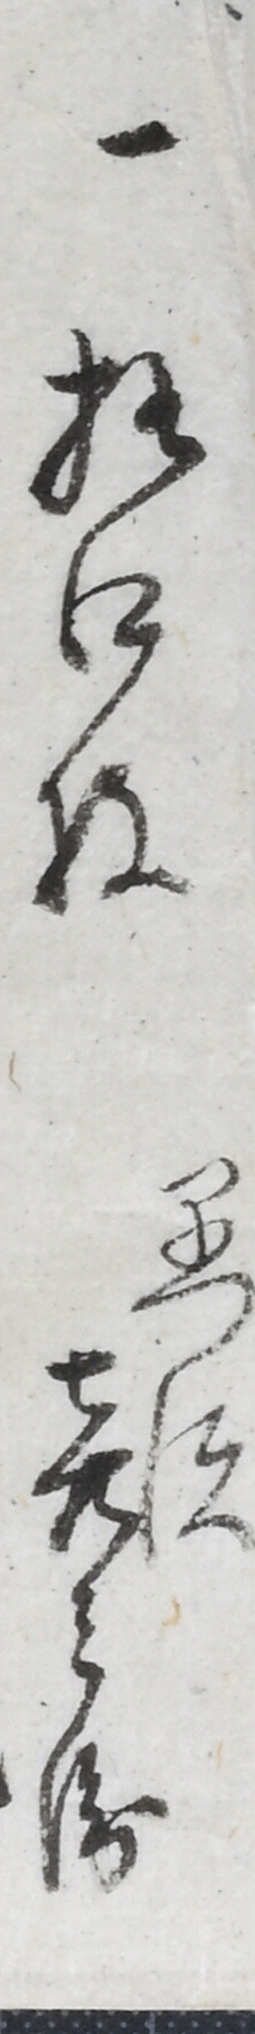一拾四枚喜兵衛
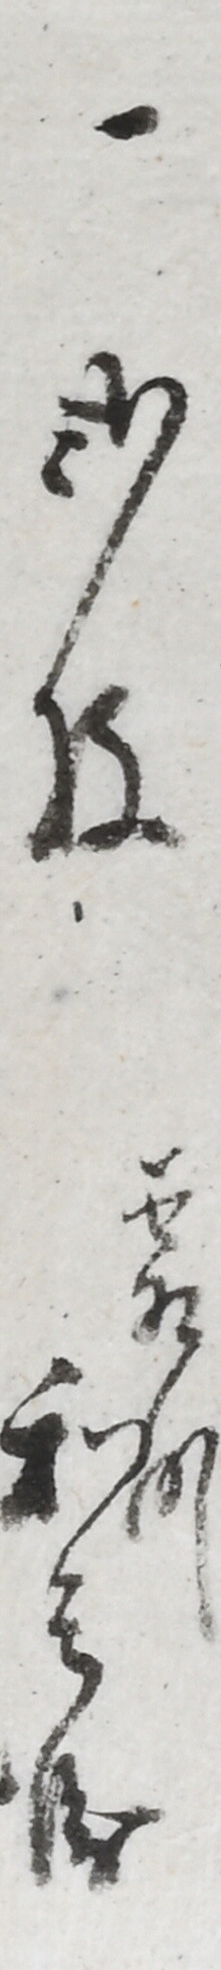一弐枚芦沢
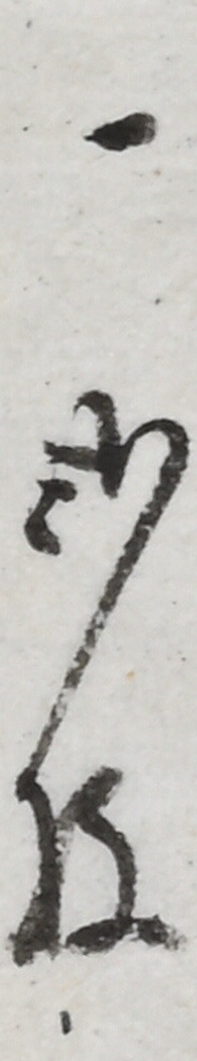一四枚
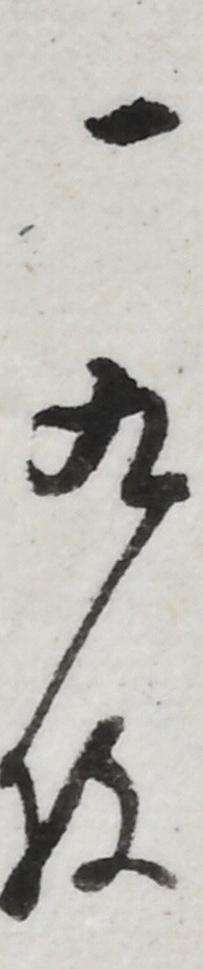一四枚
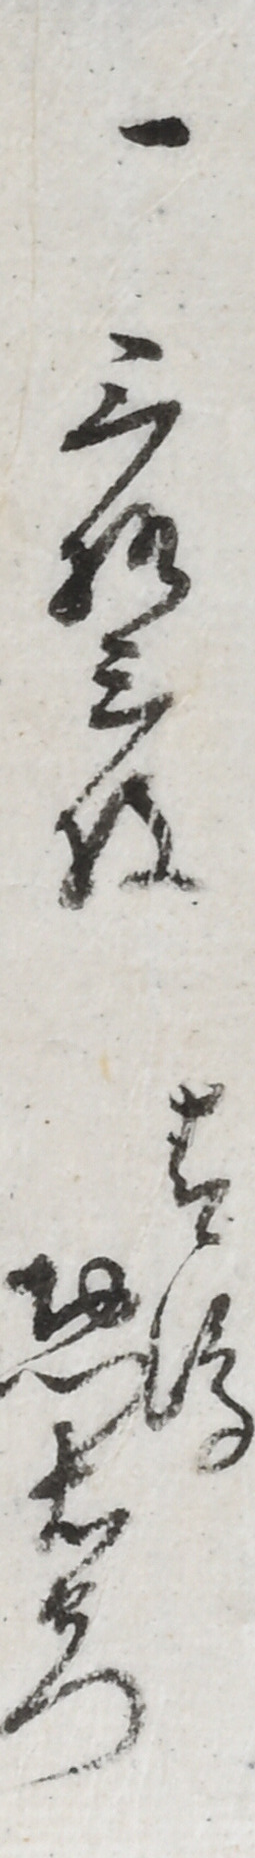一三拾三枚惣右衛門
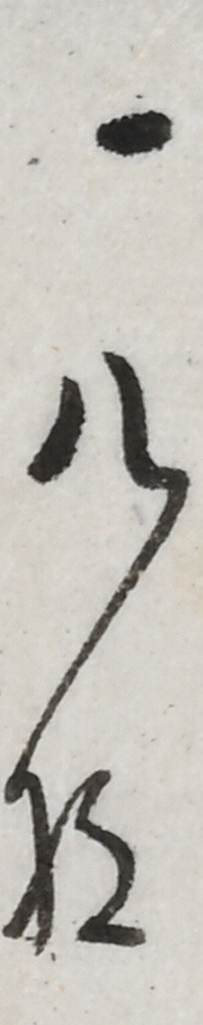一四枚
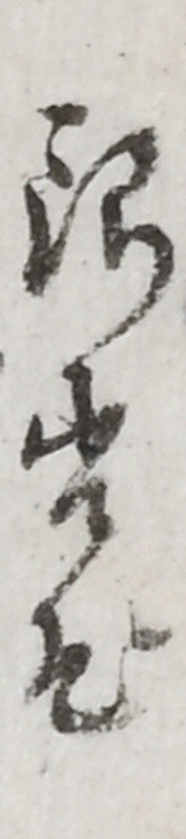銀杏屋
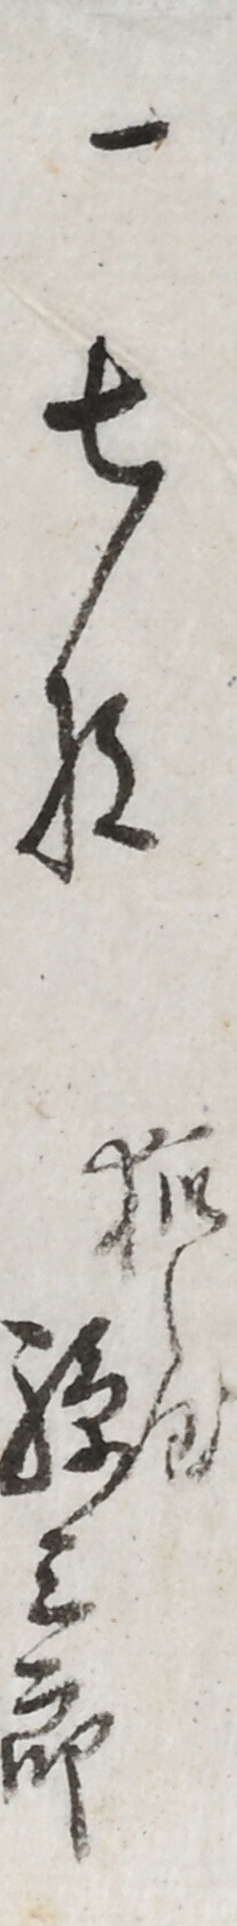一七枚孫三郎
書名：髙遠限楮幣引換覚帳
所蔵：伊那市立高遠町図書館・合同会社AMANE
